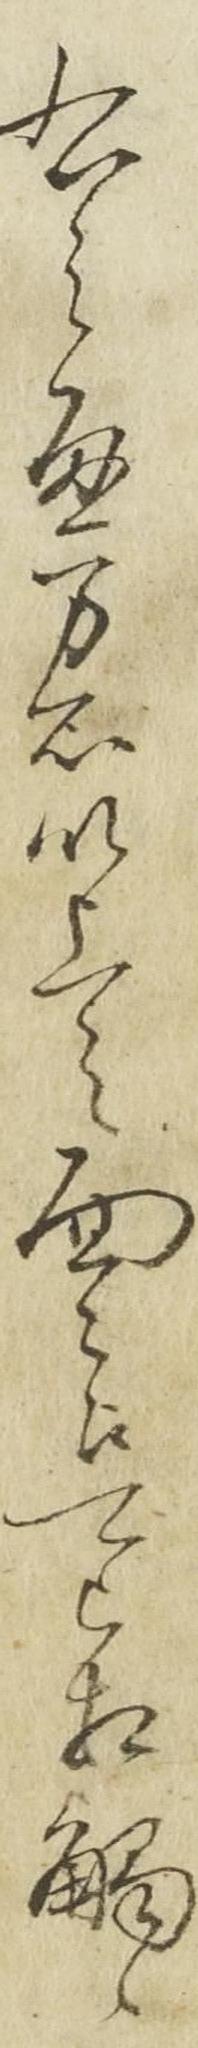右之通万石以上之面々江可被相触候
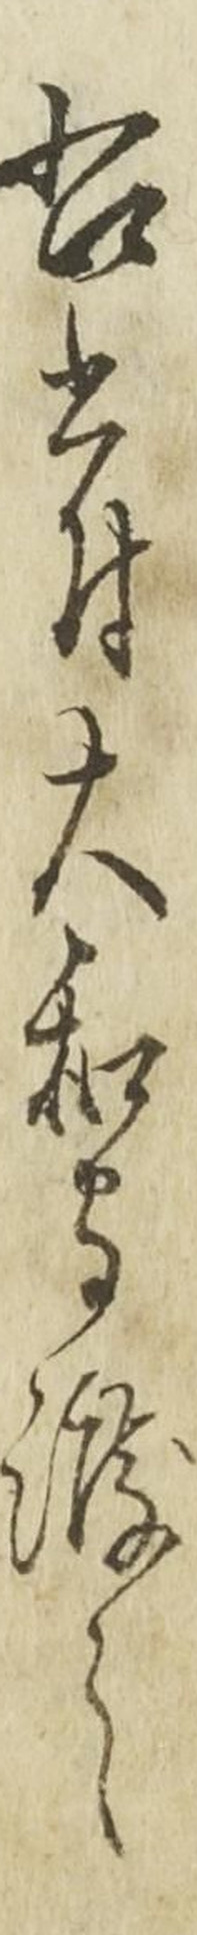右書付大和守渡之
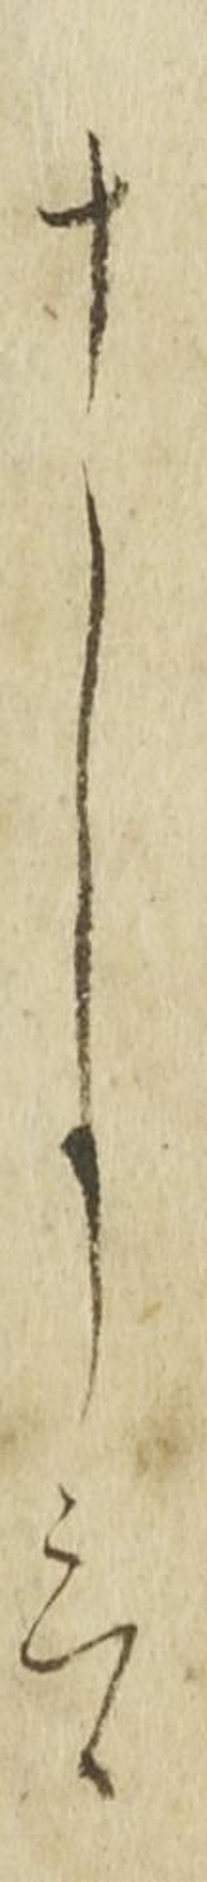十月三日
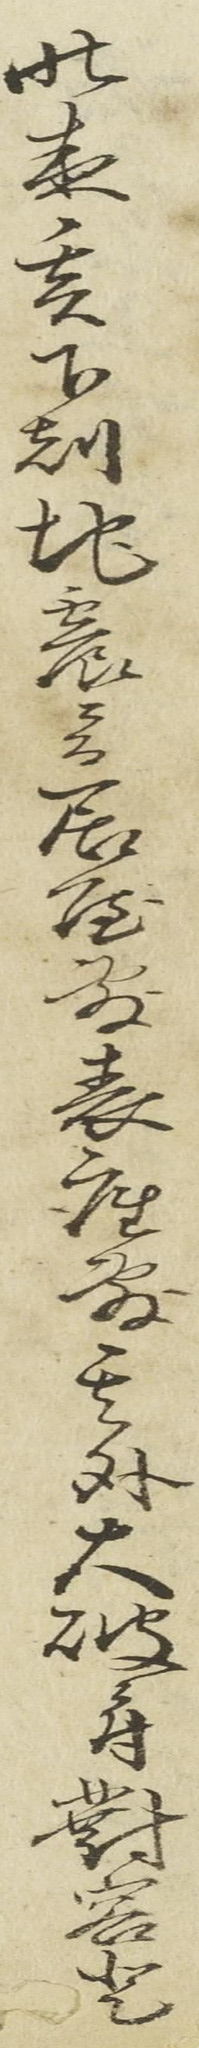昨夜亥下刻地震ニ而居屋敷表座敷其外大破ニ付対客登
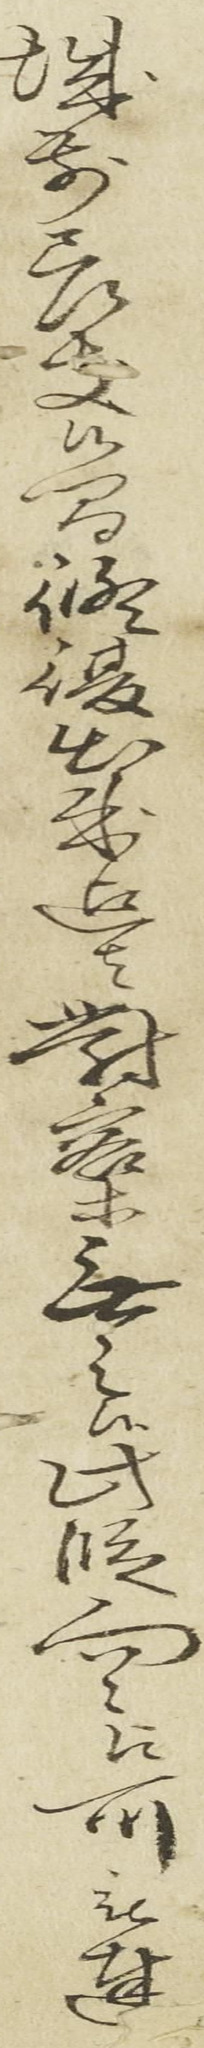城前差支候間修復出来迄者対客等無之候此段向々江可被逹
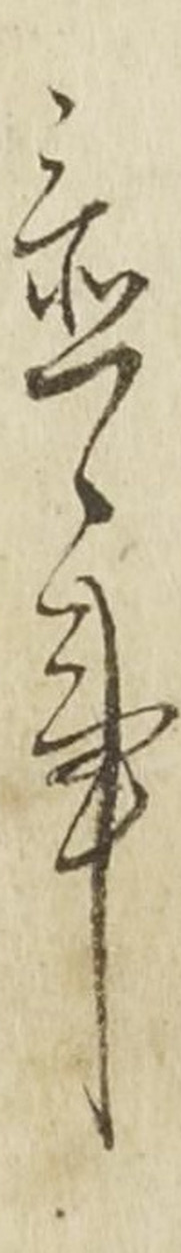置候事
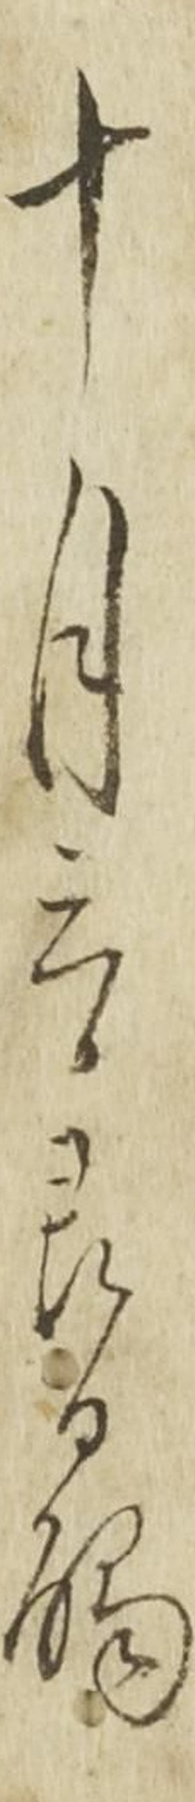十月三日即日触
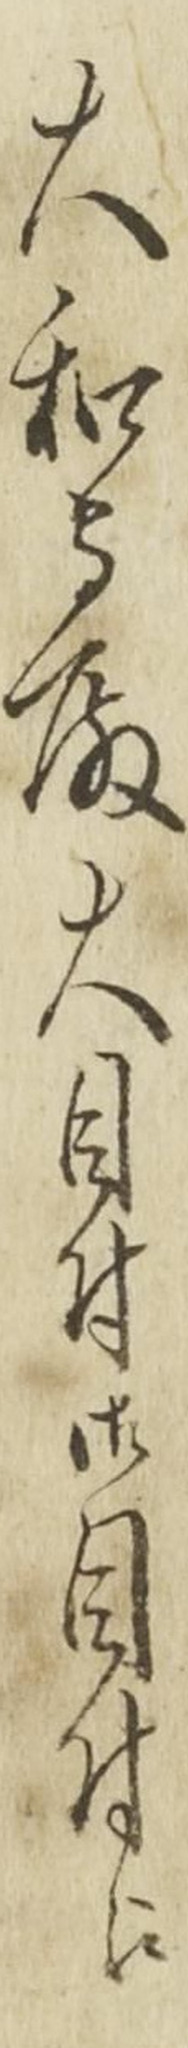大和守殿大目付御目付江
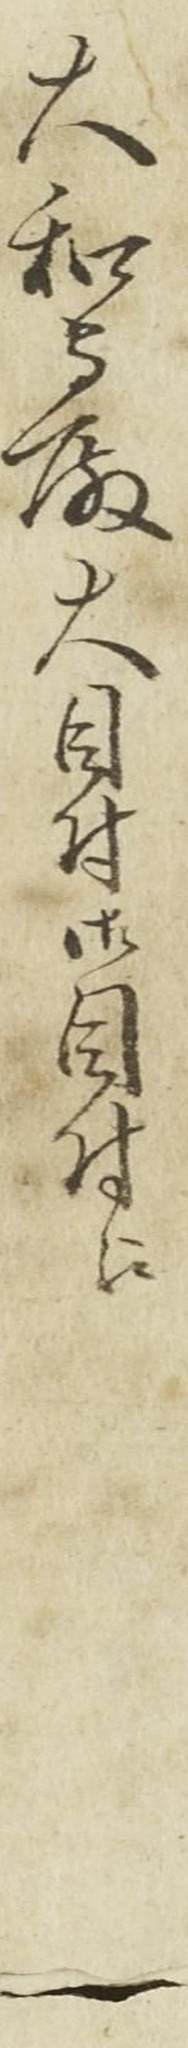大和守殿大目付御目付江
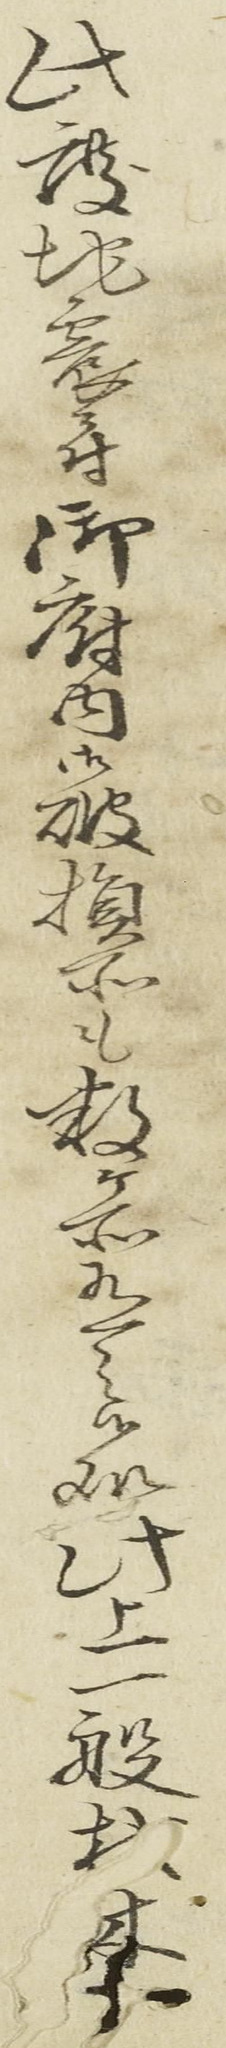此度地震ニ付御府内御破損所も数ヶ所有之候処此上一般材木
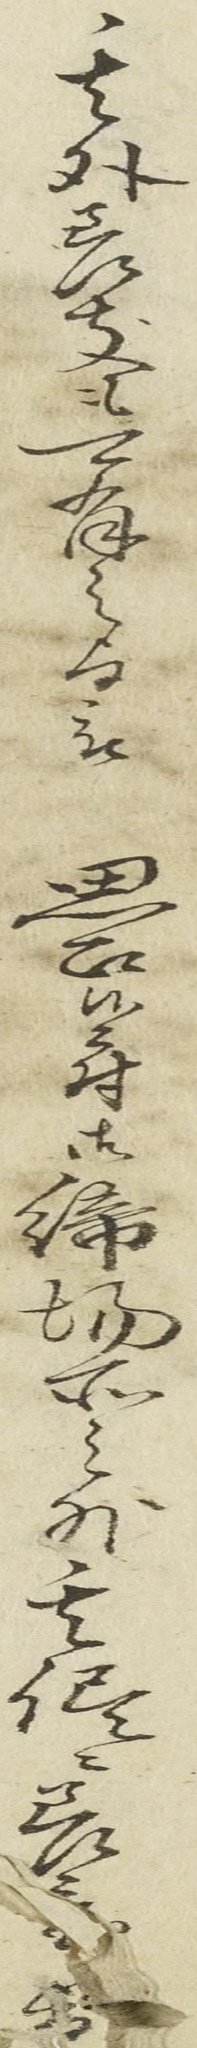其外差支も可有之旨被思召候ニ付御締場所之外其侭ニ差
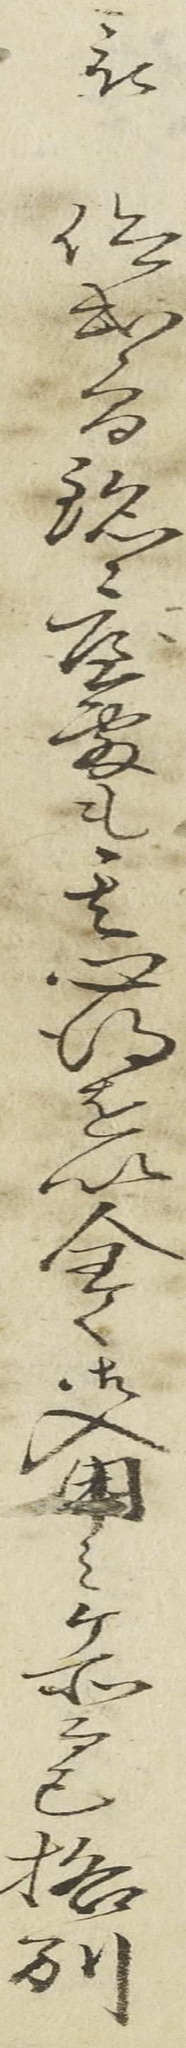被仰出候間銘々屋敷も其心得を以全く御入用之ヶ所而已格別
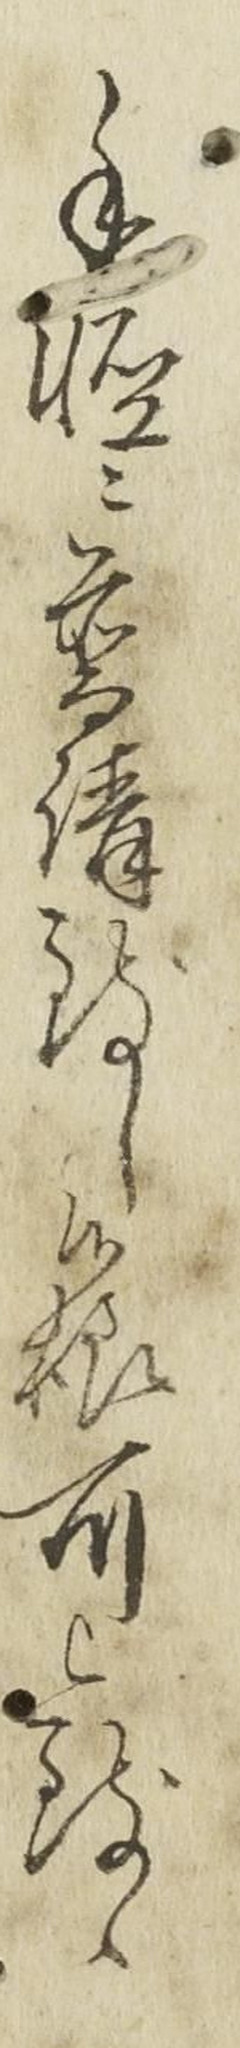手軽ニ普請致し候様可被致候
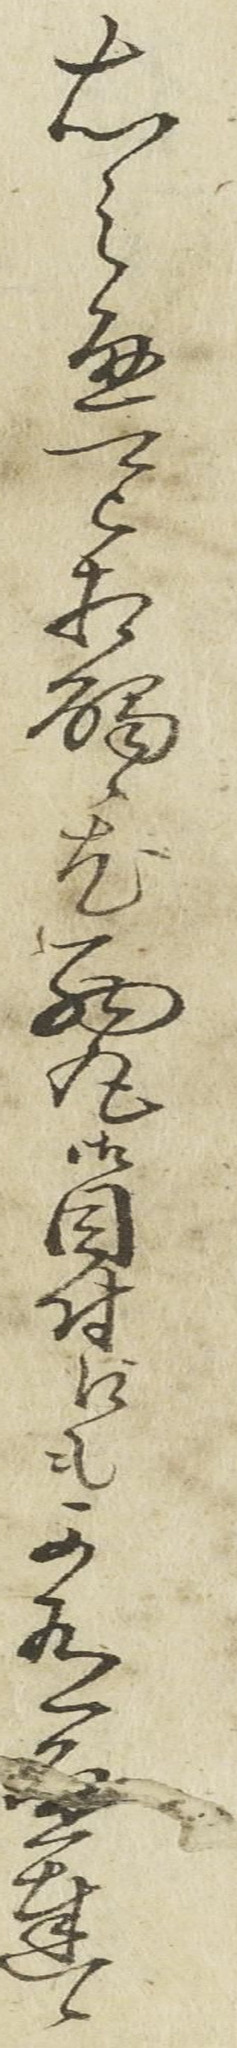右之通可被相触候尤西丸御目付江も可有通逹候
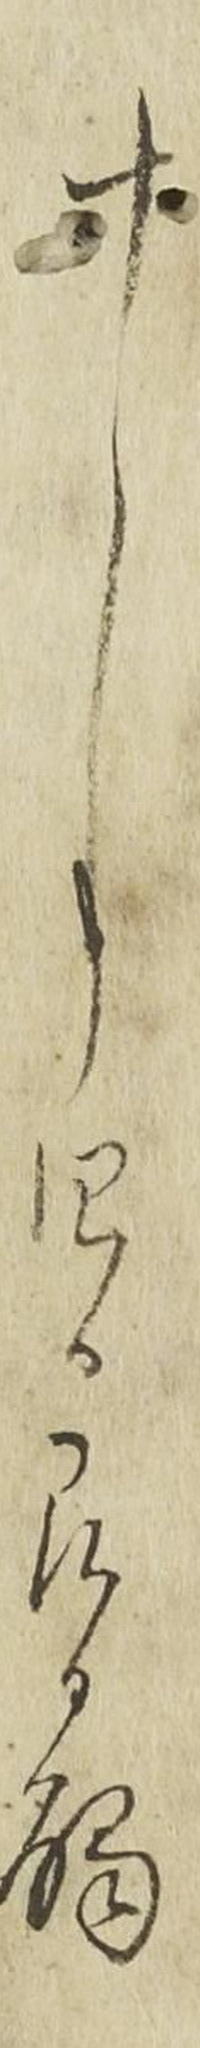十月四日即日触
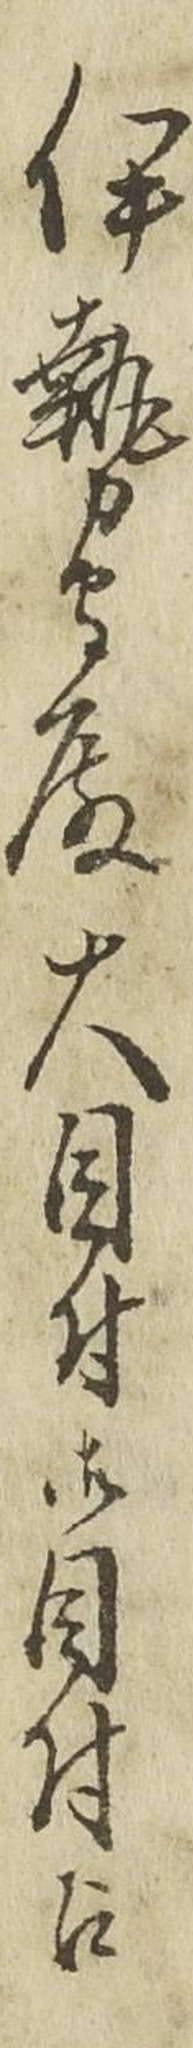伊勢守殿大目付御目付江
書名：安政二乙卯年十月二日大地震之事
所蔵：東京大学地震研究所図書室 Earthquake Research Institute Library, The University of Tokyo, JAPAN
